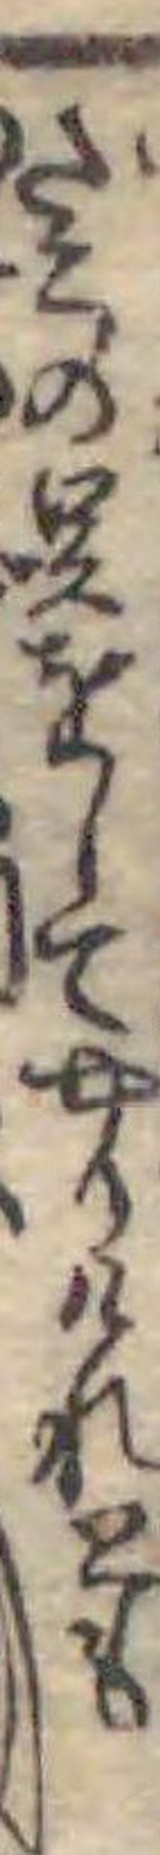たこの足をしてやりけれども
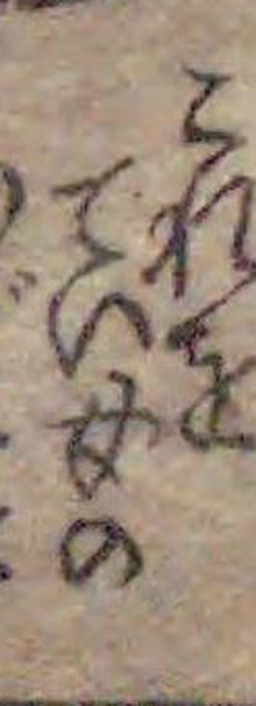てい女の
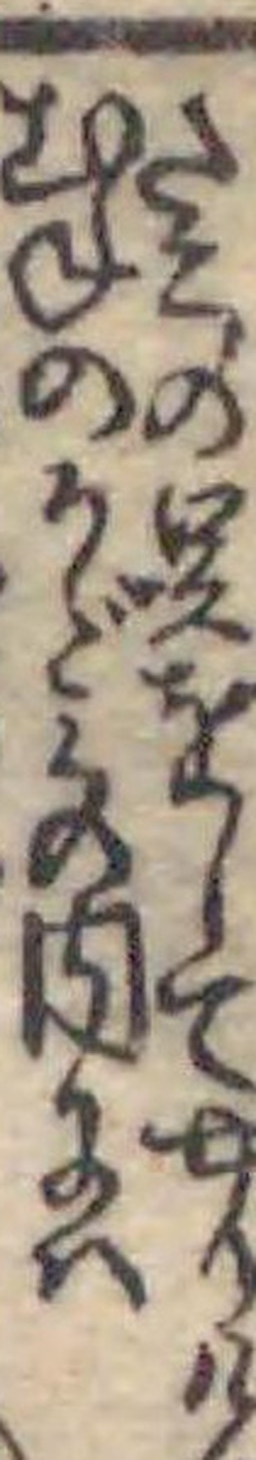むねのかゞみの内には
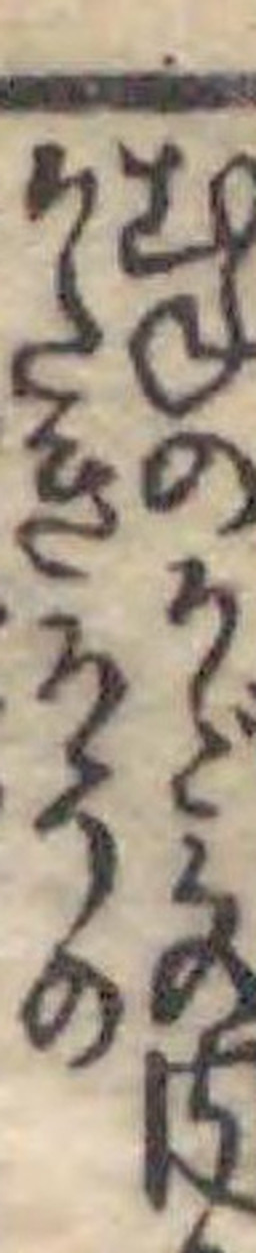かたきかうの
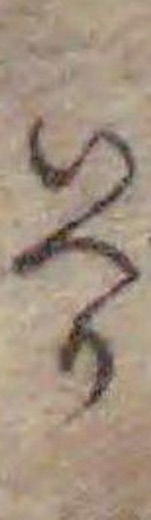いへり
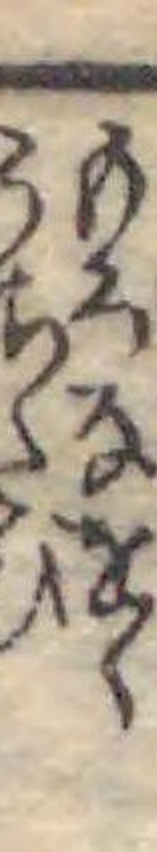うちたひ
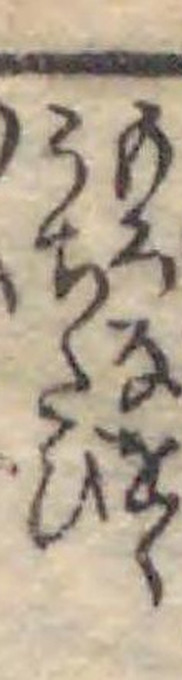うちたひ
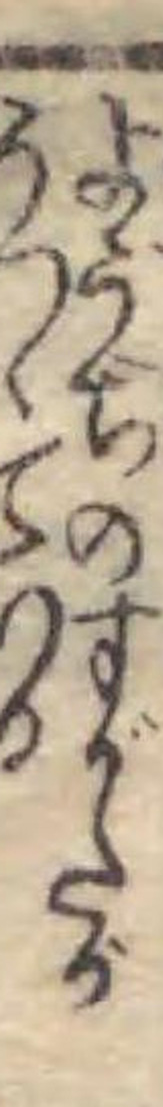ようちのすがたが
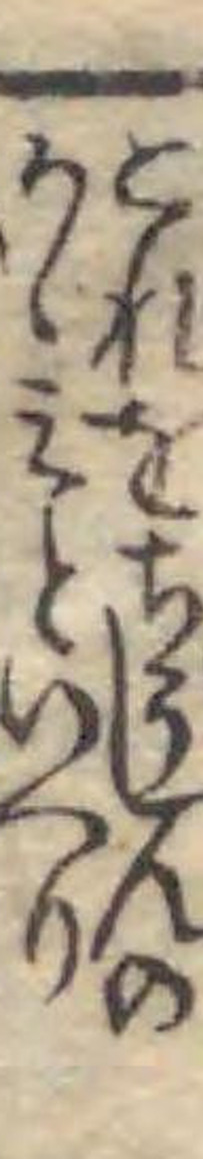かゝみといへり
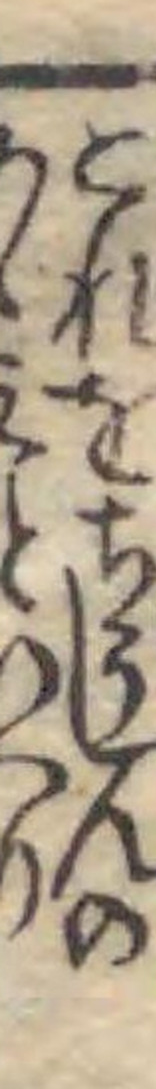これをちうしんの
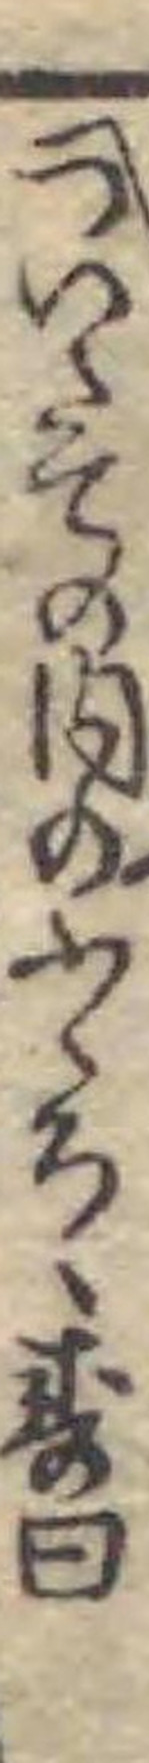〽ついたての内のふくろく寿曰
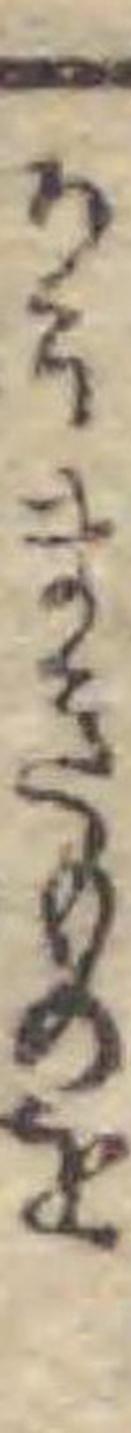かうまきものを
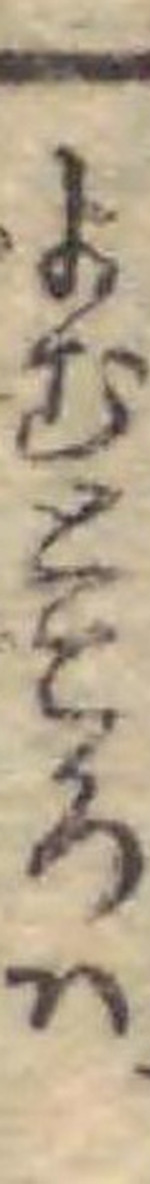よむところは
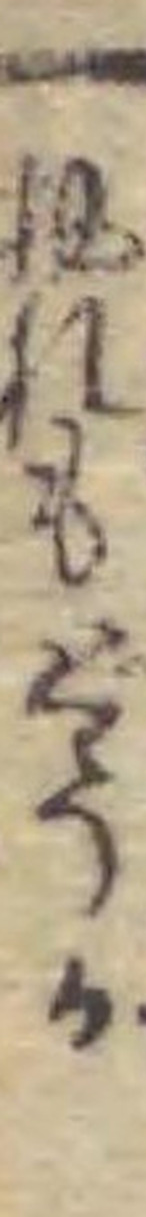おれもどうか
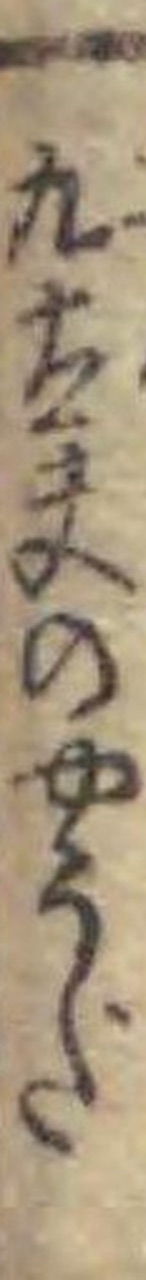九太夫のやうだ
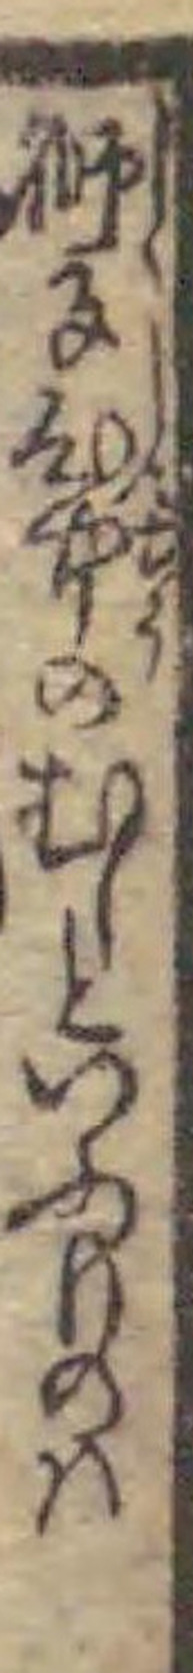獅子心中のむしといふものは
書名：人心鏡写絵 : 3巻
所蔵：国立国会図書館 National Diet Library, JAPAN
